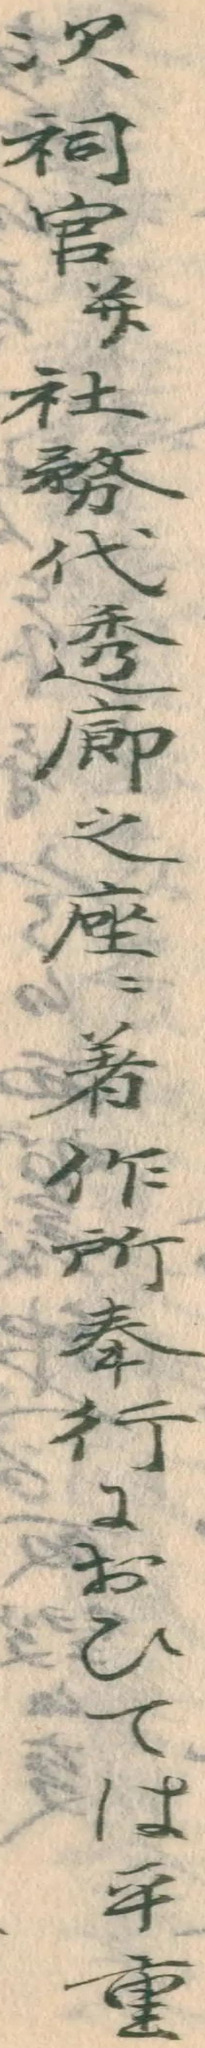次祠官并社務代透廊之座ニ着作所奉行におひては平重
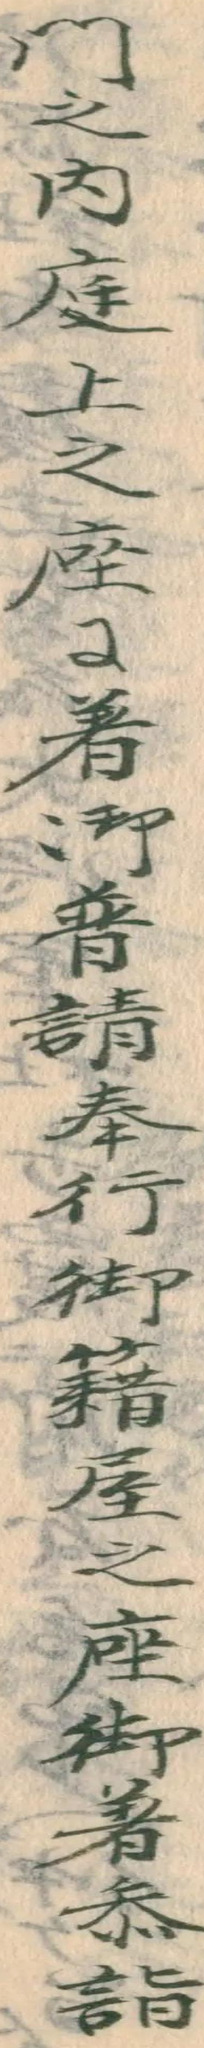門之内庭上之座に着御普請奉行御籍屋之座御着参詣
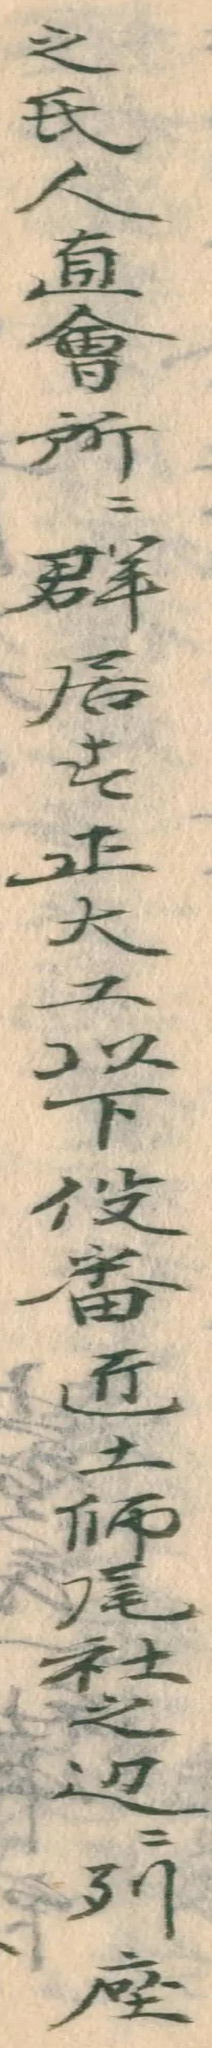之氏人直会所ニ群居す正大工以下役番匠土師尾社之辺ニ列座
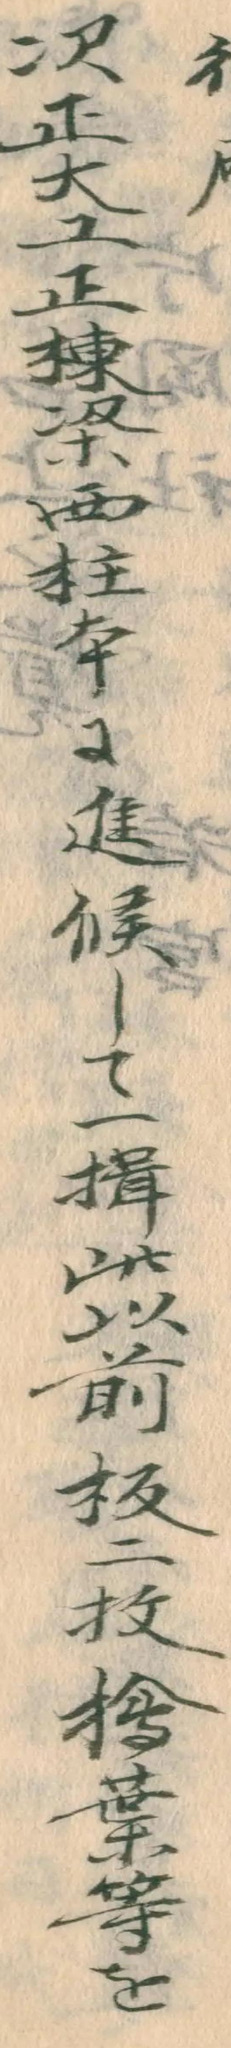次正大工正棟梁西柱本に進候して一揖此以前板二枚檜葉等を
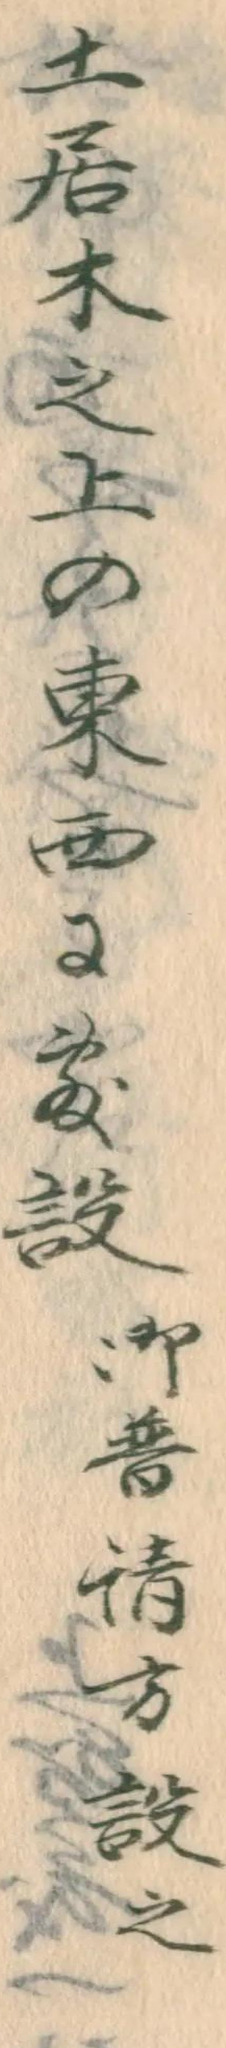土居木之上の東西に敷設御普請方設之
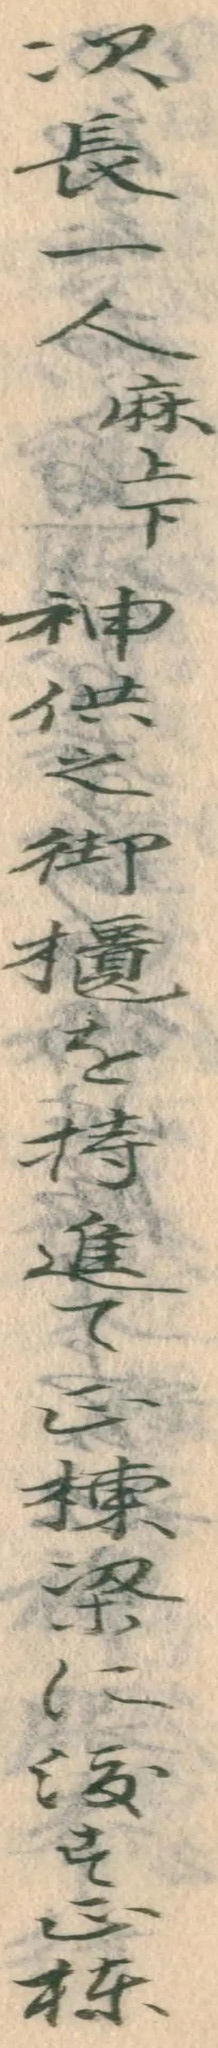次長一人麻上下神供之御櫃を持進て正棟梁に渡す正棟
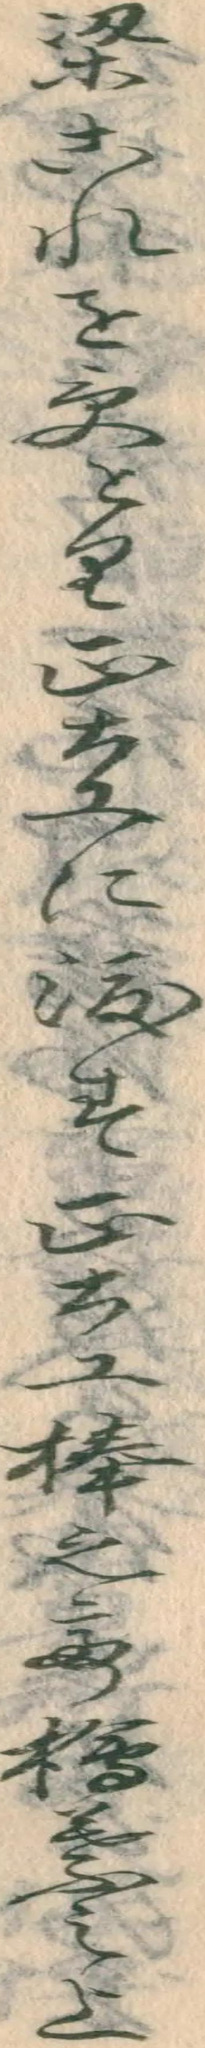梁これを受とり正大工に渡す正大工捧之て檜葉之上
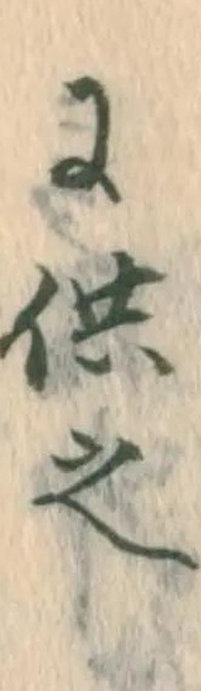に供之
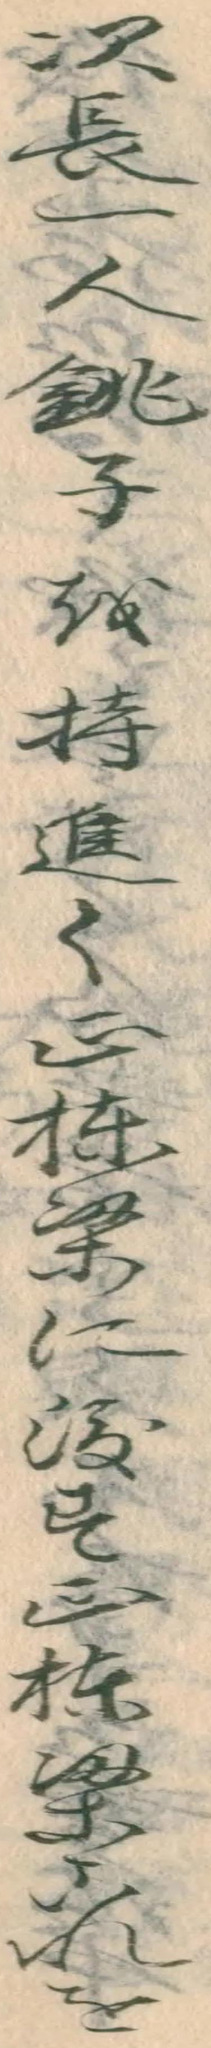次長一人銚子を持進て正棟梁に渡す正棟梁これを
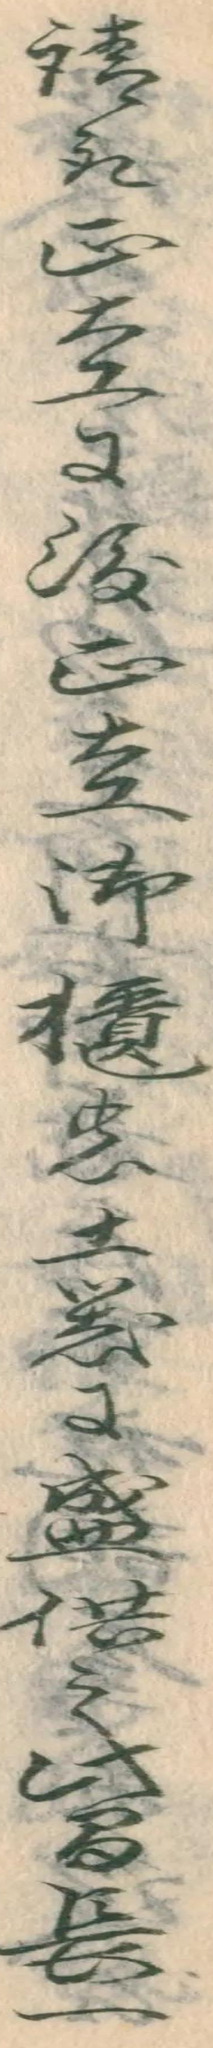請取正大工に渡正大工御櫃の土器に盛供之此間長一
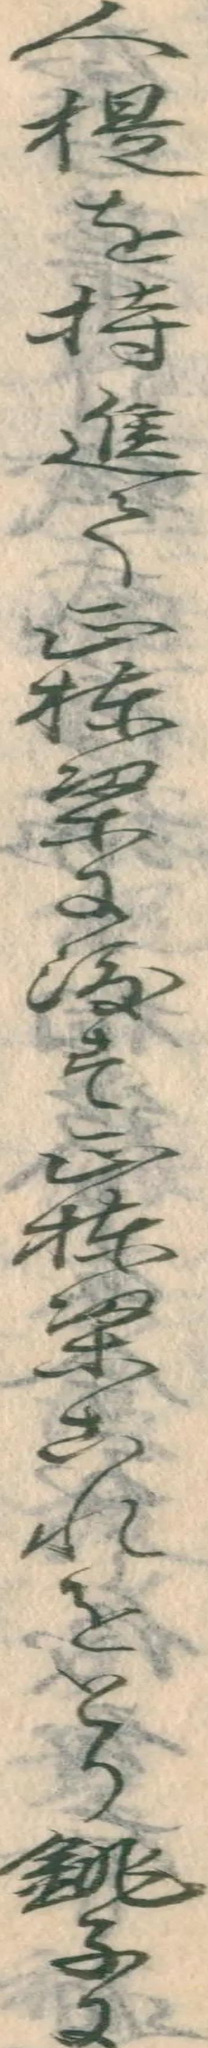人提を持進て正棟梁に渡す正棟梁これをとり銚子に
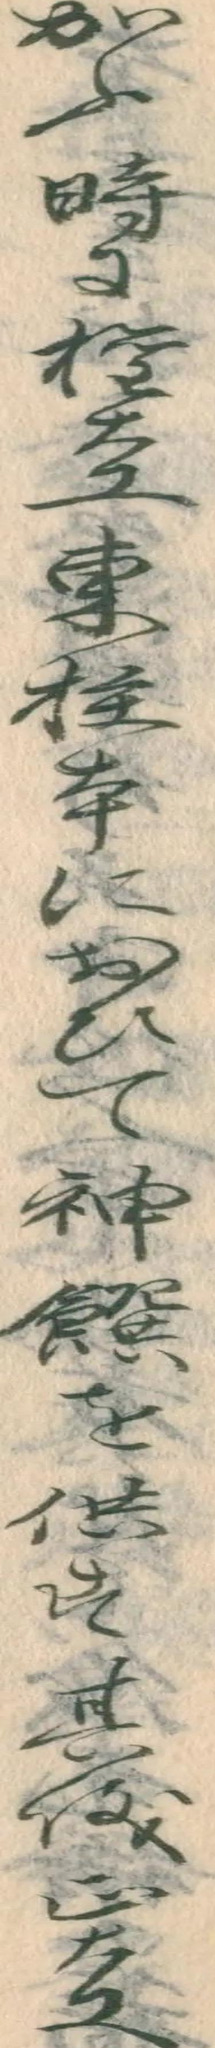加ふ時に権大工東柱本におひて神饌を供す其儀正大工
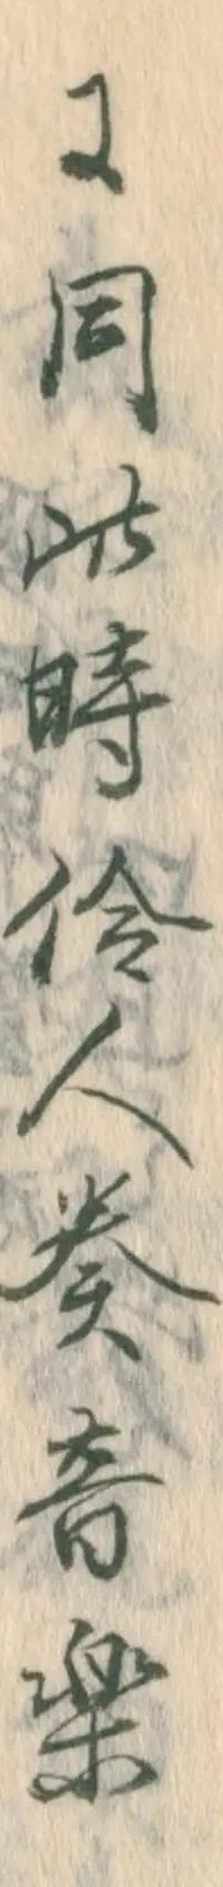に同此時伶人奏音楽
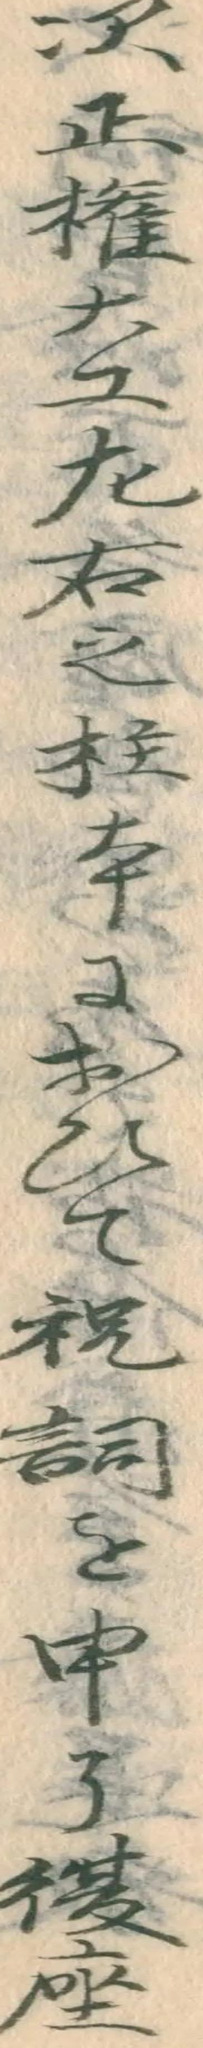次正権大工左右之柱本におひて祝詞を申了復座
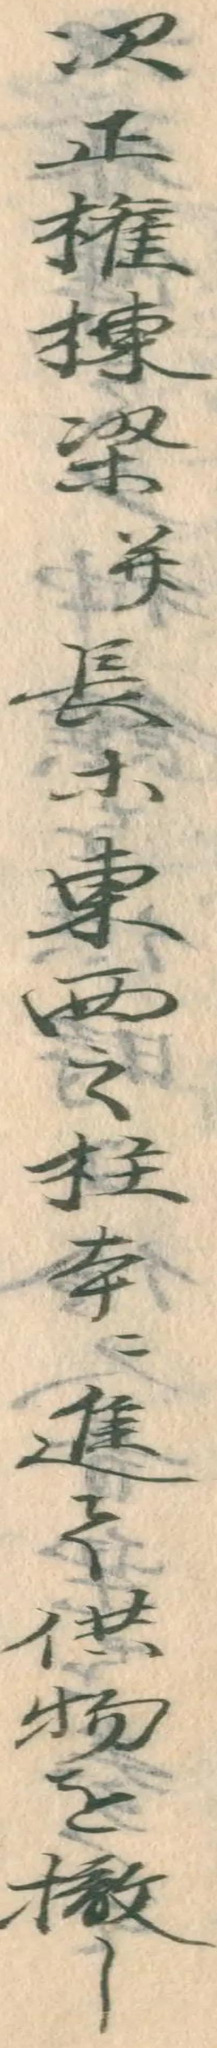次正権棟梁并長等東西之柱本ニ進て供物を撤し

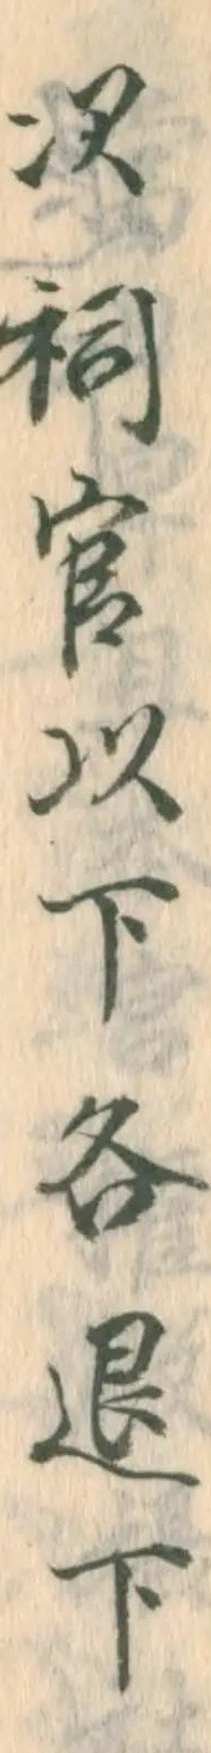次祠官以下各退下
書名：賀茂社記録. 第17冊
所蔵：国立国会図書館 National Diet Library, JAPAN
